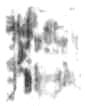嘉
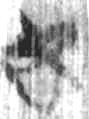女
